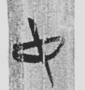中（仲）
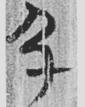弓
